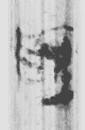聖
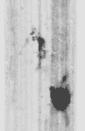人
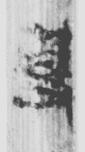史
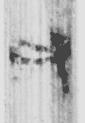又
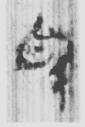色
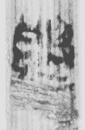𪴿
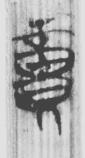{畐貝}
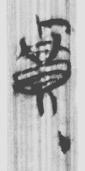貴
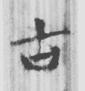古
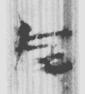厇
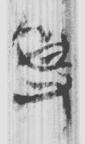事
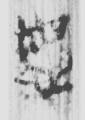悔
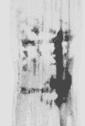𢝬
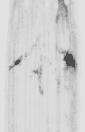大
